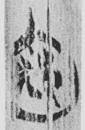○（淵）
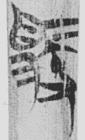○（馭）
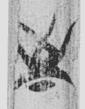至
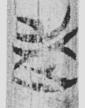老
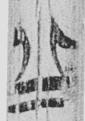丘
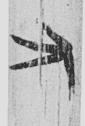又（有）
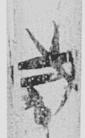戎（農）
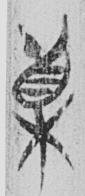植
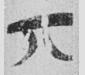亓（其）
